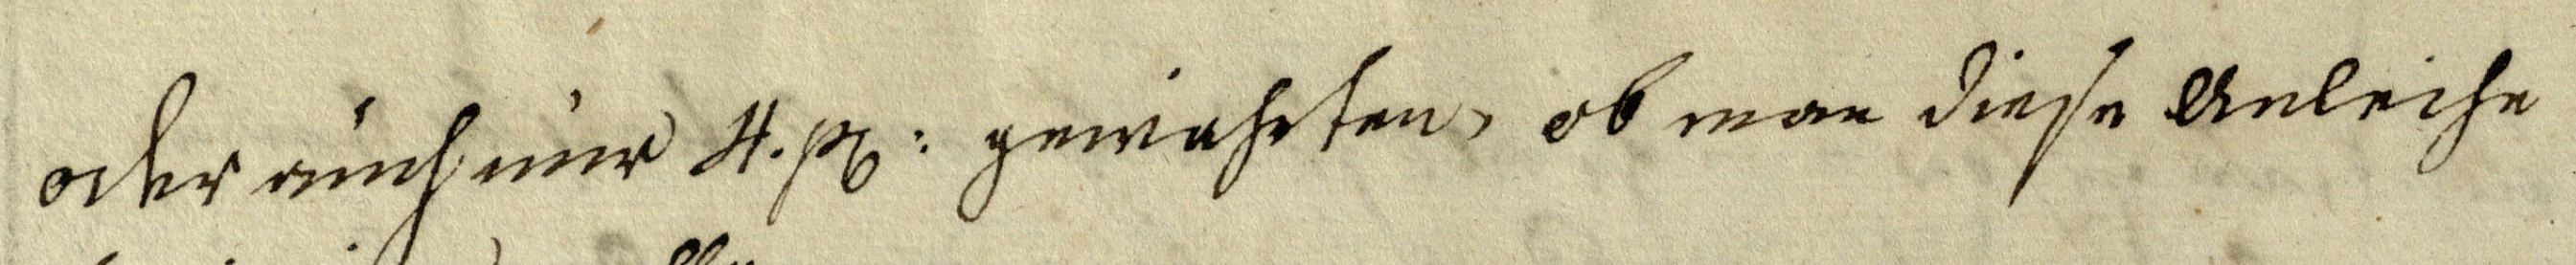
oder auch nur 4. p. gewährten, ob man diese Anleihe
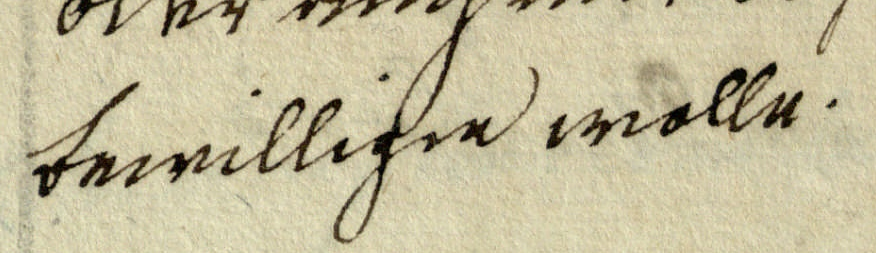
bewilligen wolle.
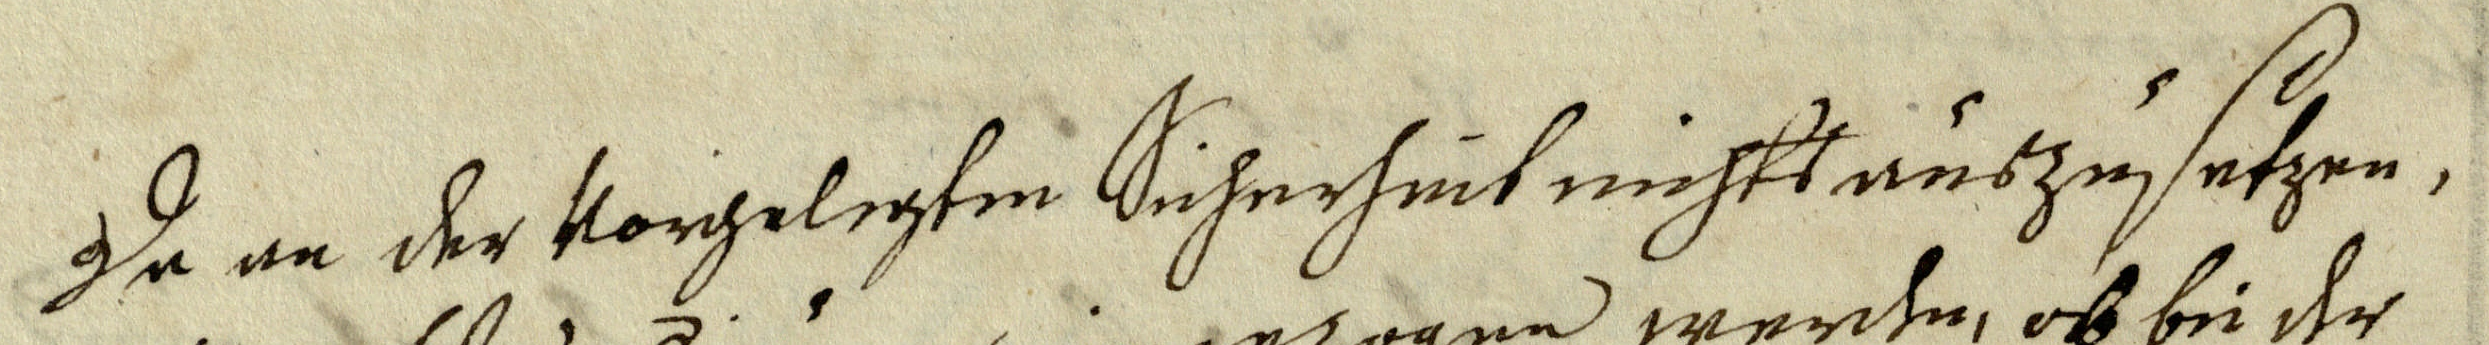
Da an der vorgelegten Sicherheit nichts auszusetzen,
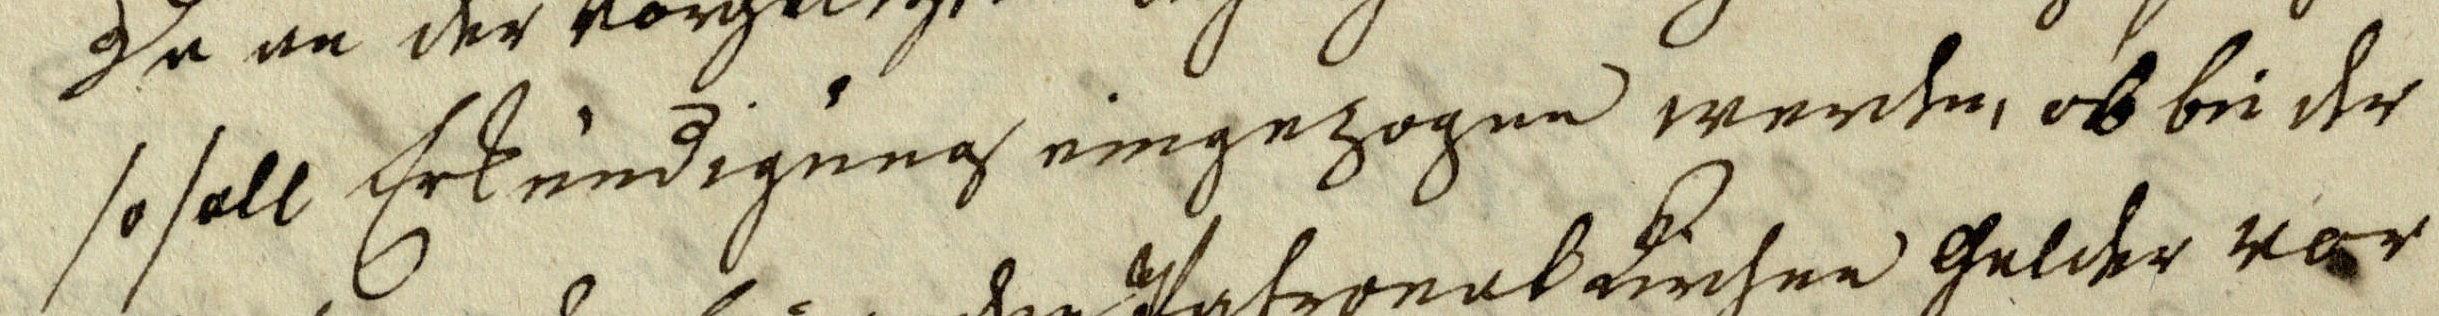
so soll Erkundigung eingezogen werden, ob bei der
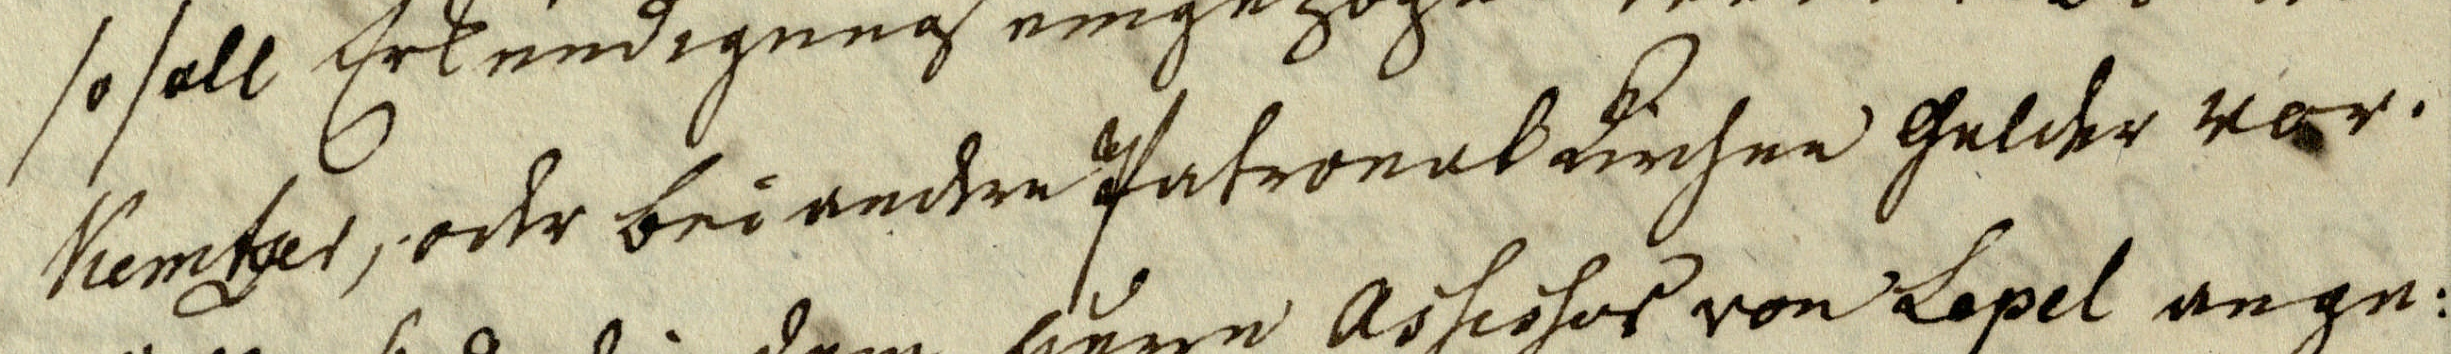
Kemtzer, oder bei andern Patronat Kirchen Gelder vor¬
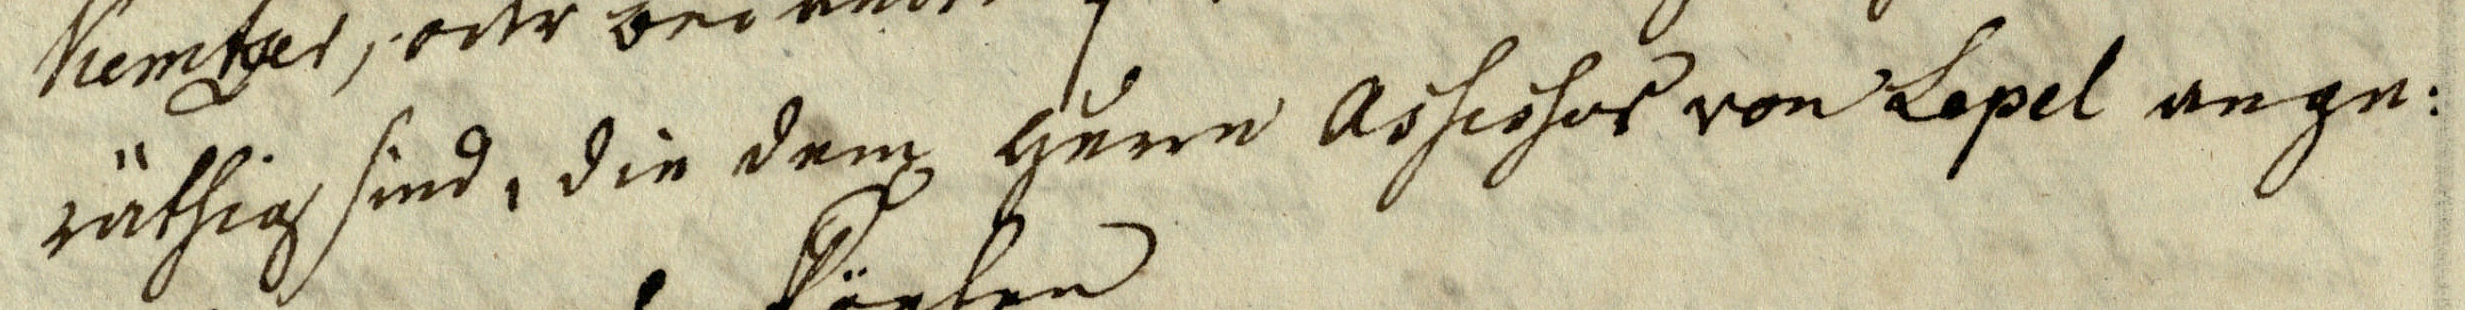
räthig sind, die dem Herrn Assessor von Lepel ange¬
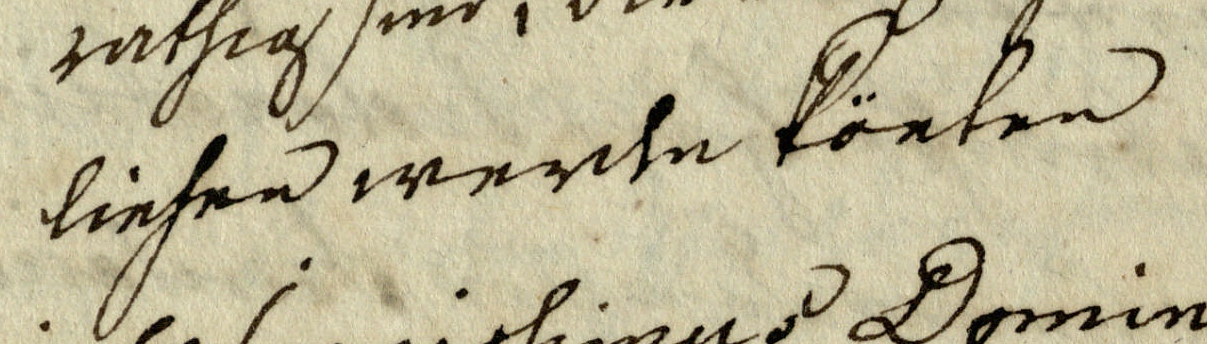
liehen werden könten.
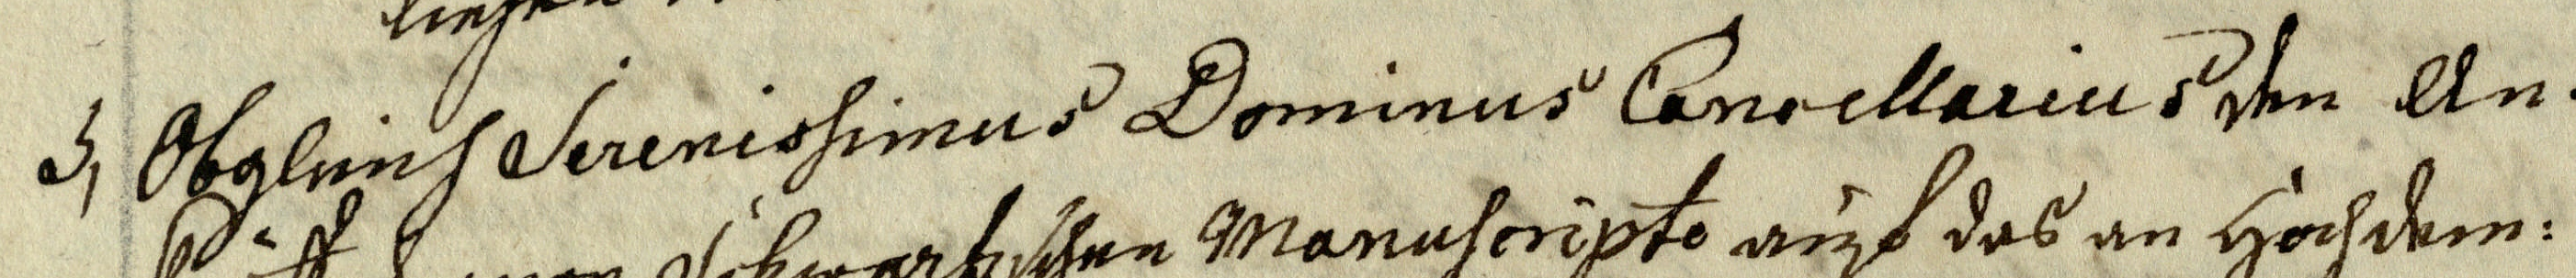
5, Obgleich Serenissimus Dominus Cancellarius den An¬
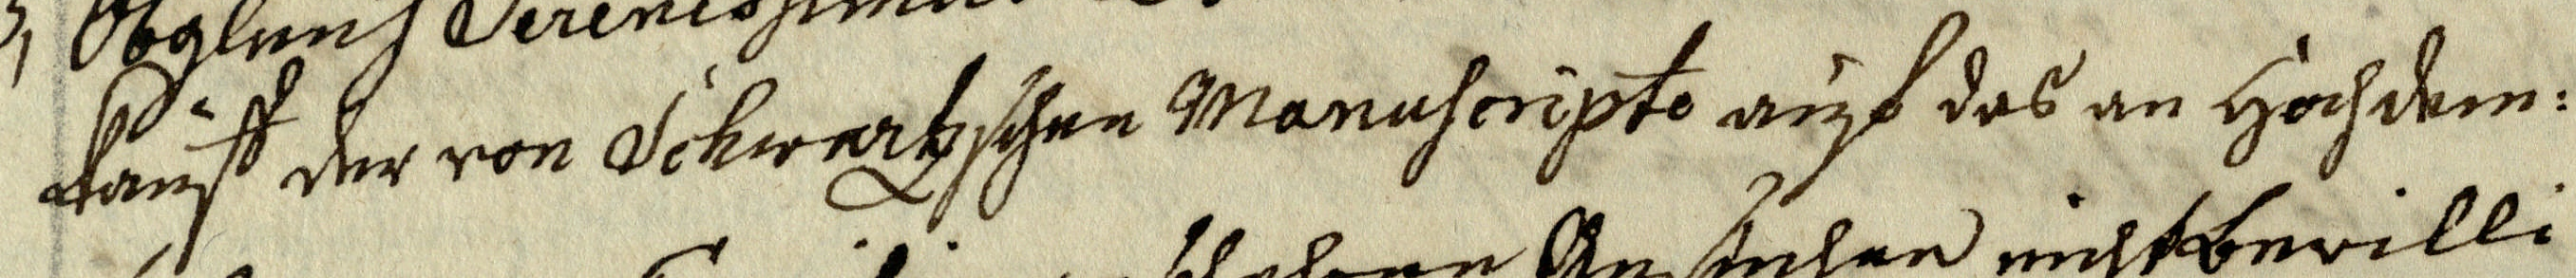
kauf der von Schwartzschen Manuscripte auf das an Hochdem¬
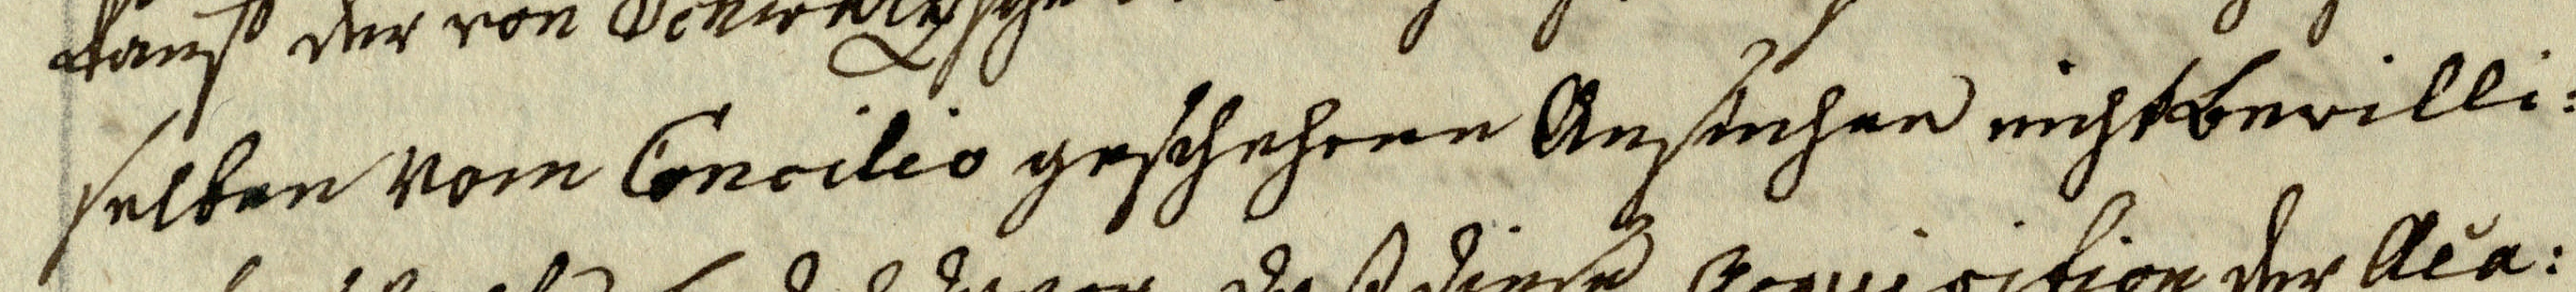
selben vom Concilio geschehenen Ansuchen nicht bewilli¬
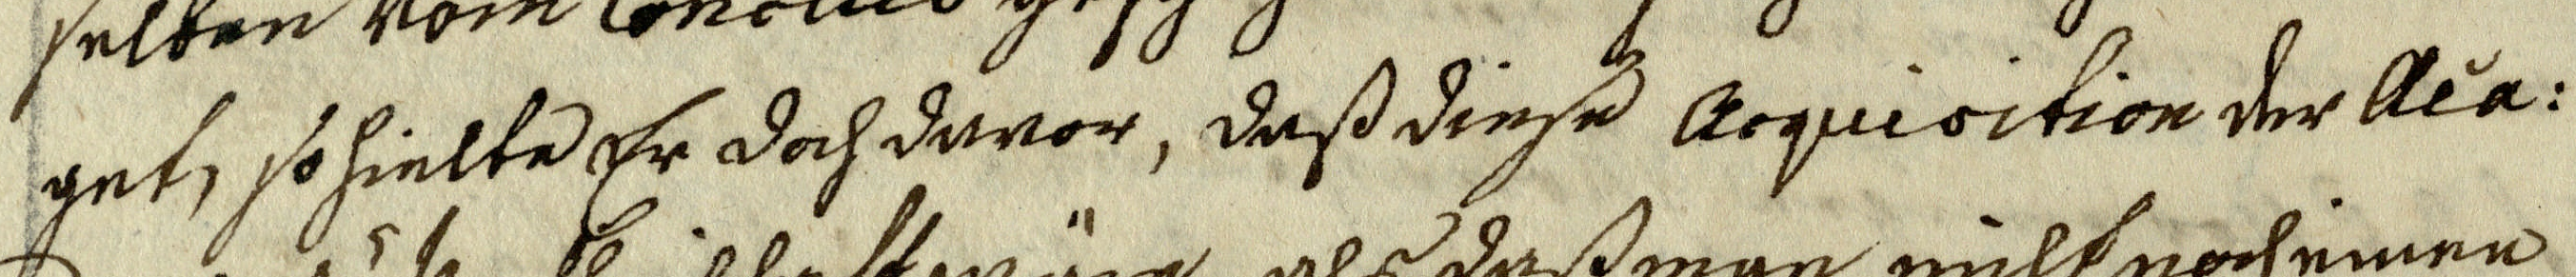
get, so hielte Er doch davor, daß diese Acquisition der Aca¬
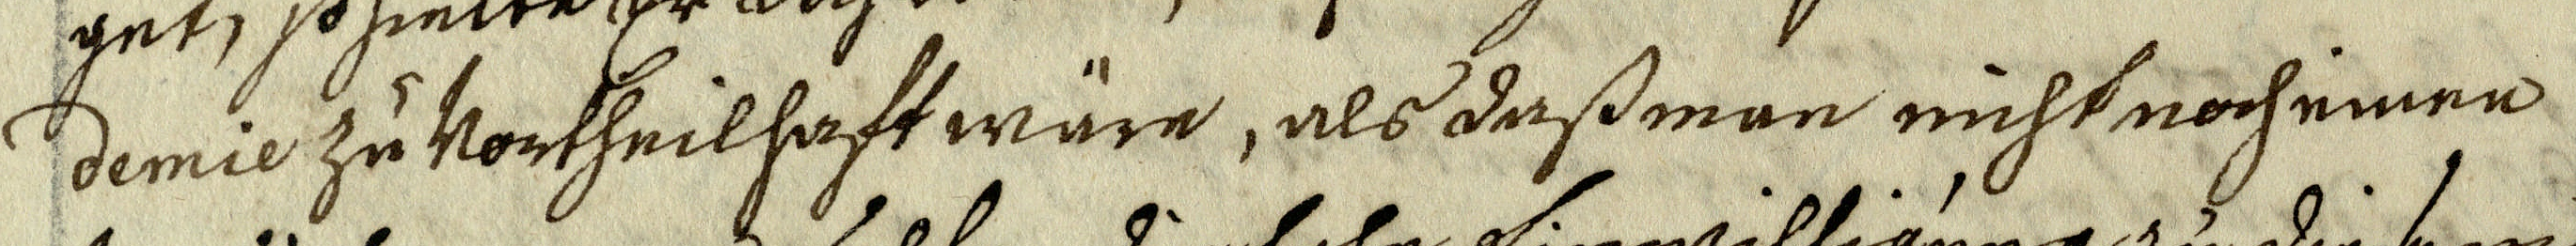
demie zu vortheilhaft wäre, als daß man nicht noch einen
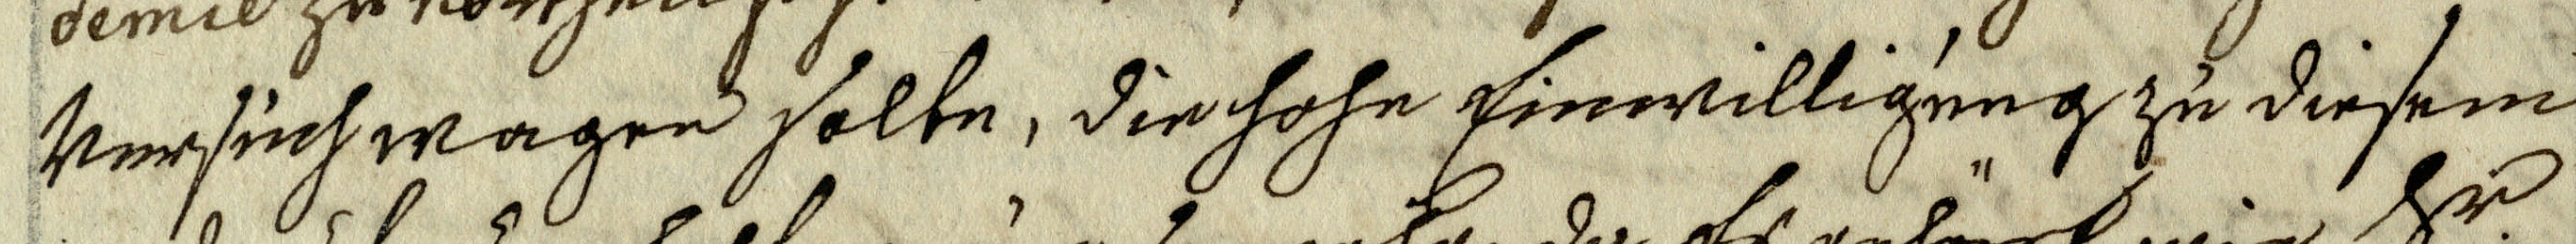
Versuch wagen solte, die hohe Einwilligung zu diesem
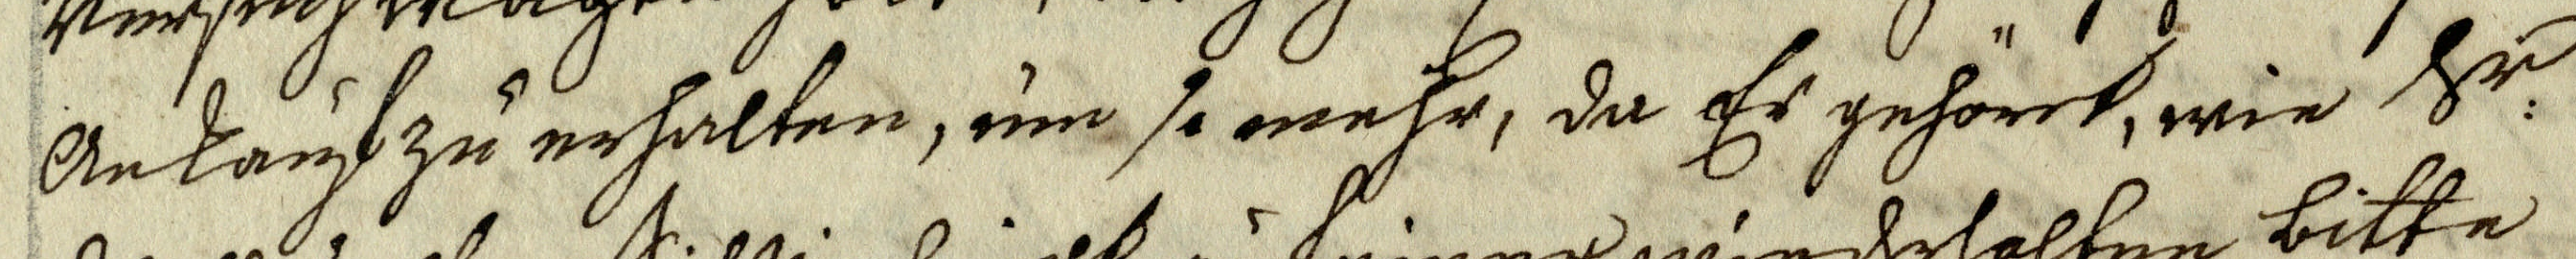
Ankauf zu erhalten, um so mehr, da Er gehöret, wie Sr.
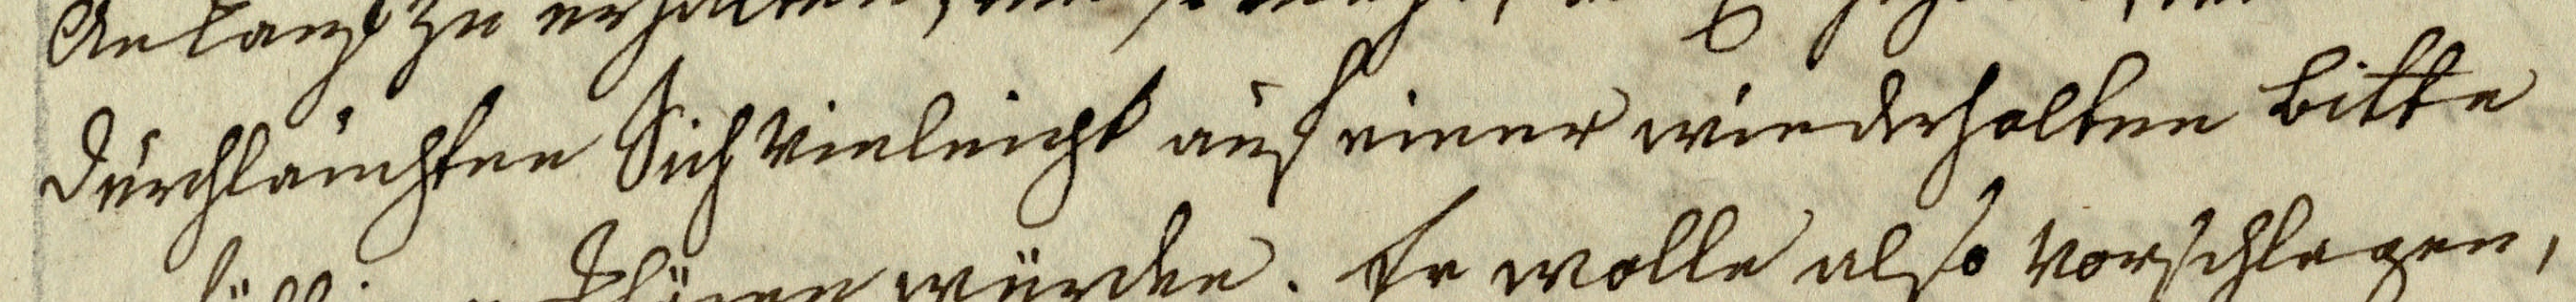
Durchlauchten Sich vieleicht auf einer wiederholten Bitte
